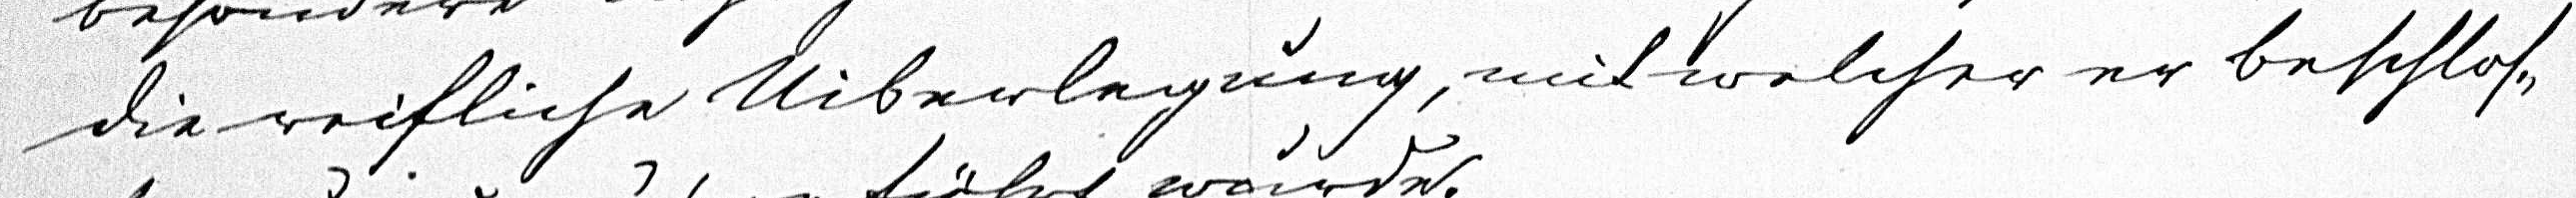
die reifliche Uiberlegung, mit welcher er beschlos¬
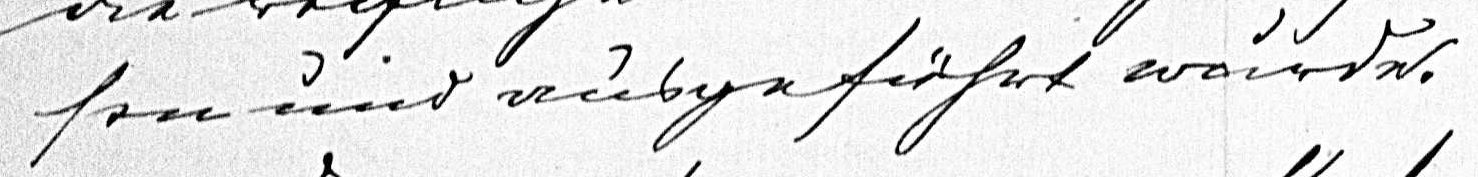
sen und ausgeführt werde.
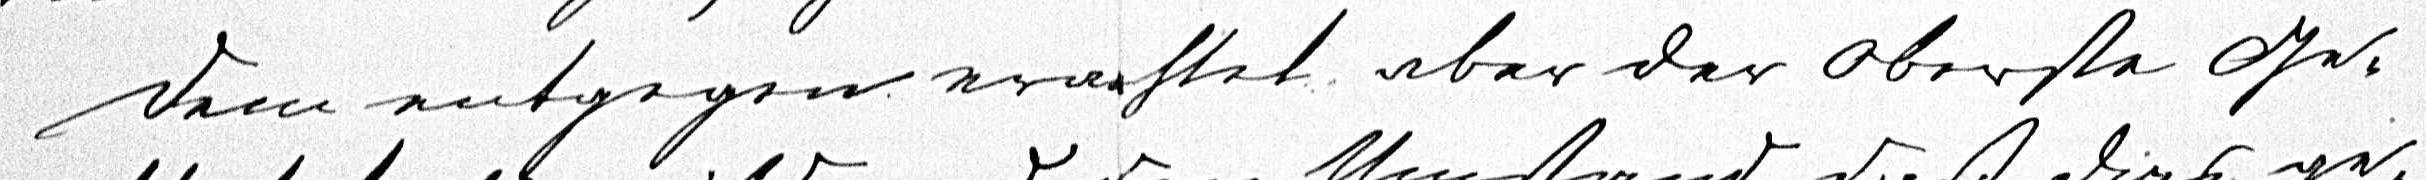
Dem entgegen erachtet aber der Oberste Ge¬
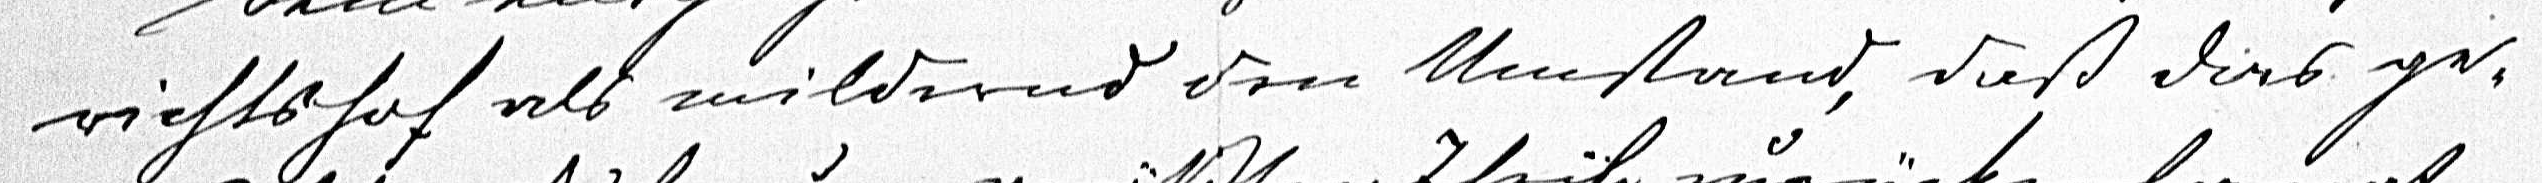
richtshof als mildern den Umstand, das das ge¬
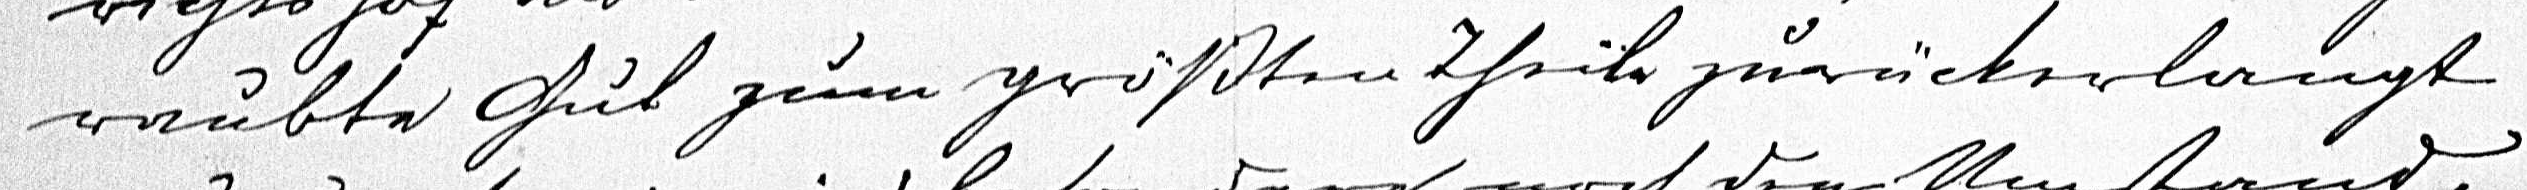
raubte Gut zum größten Theile zurückerlangt
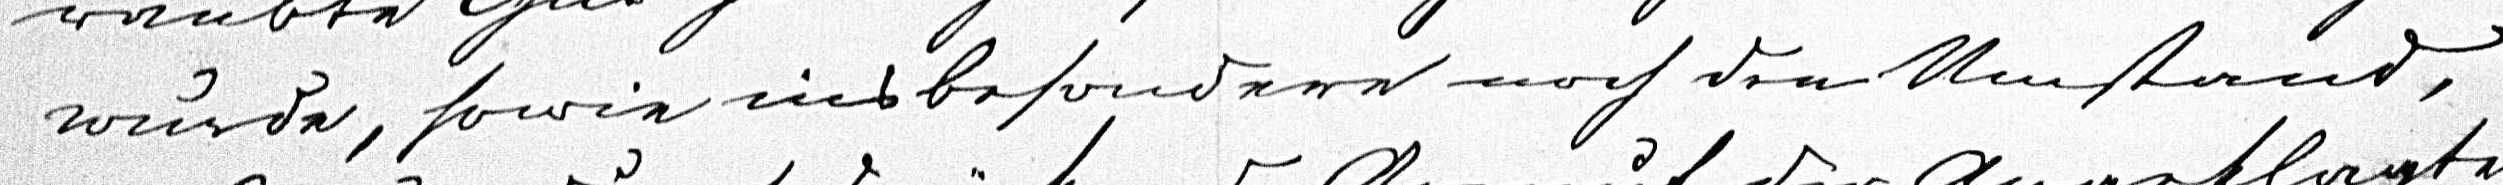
wurde, sowie insbesondere noch den Umstand,
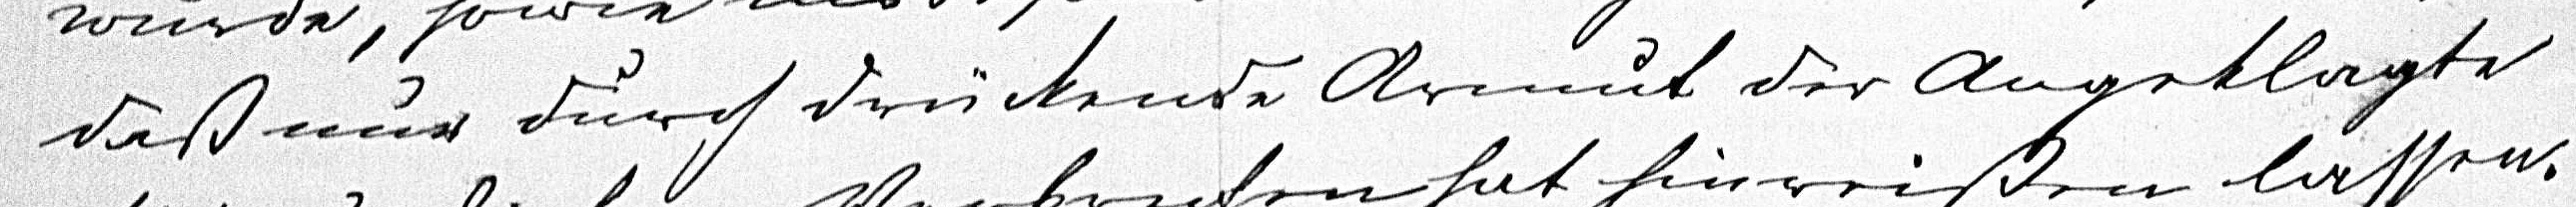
daß nur durch drückende Armut der Angeklagte
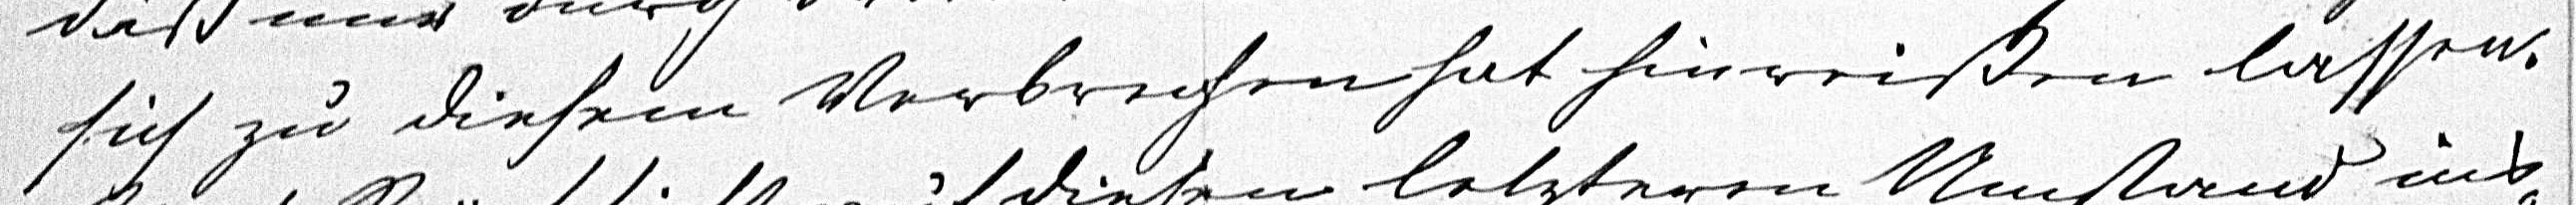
sich zu diesem Verbrechen hat hinreißen lassen.
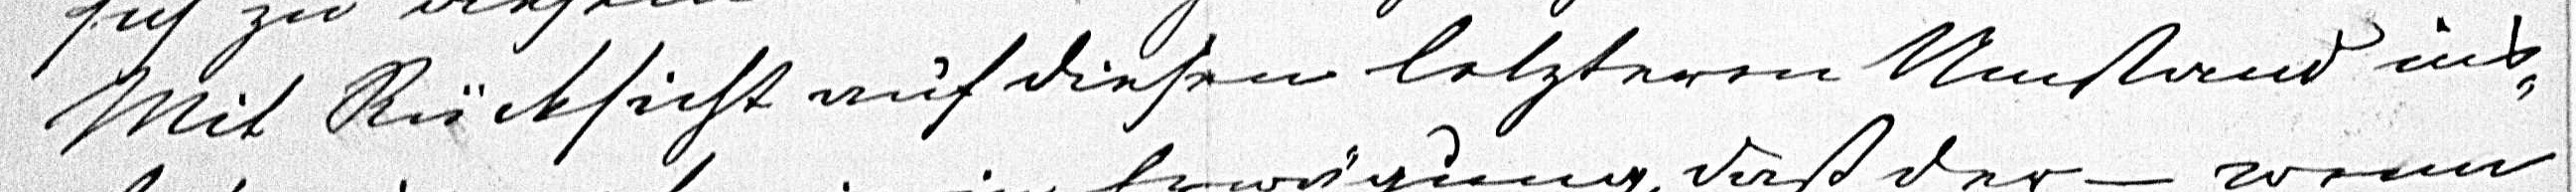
Mit Rücksicht auf diesen letzteren Umstand ins¬
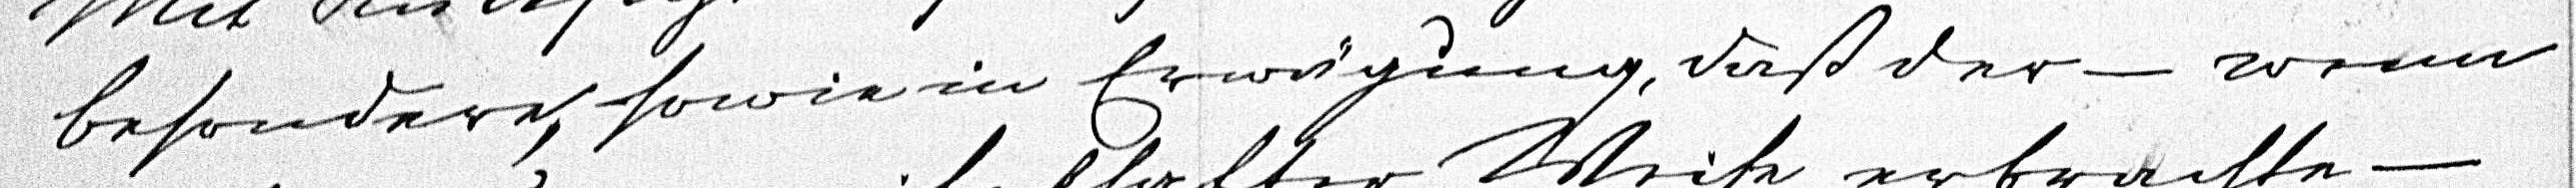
besondere, sowie in Erwägung, daß der – wenn
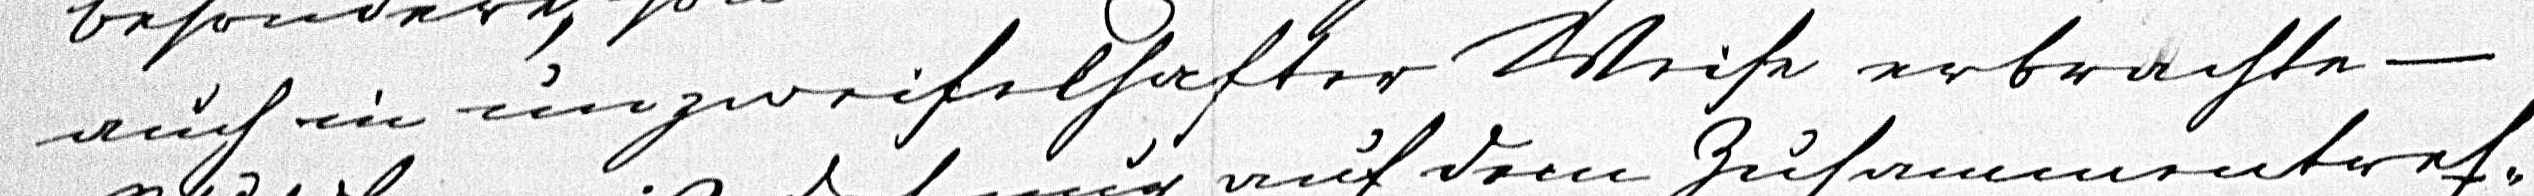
auch in unzweifelhafter Weise erbrachte –
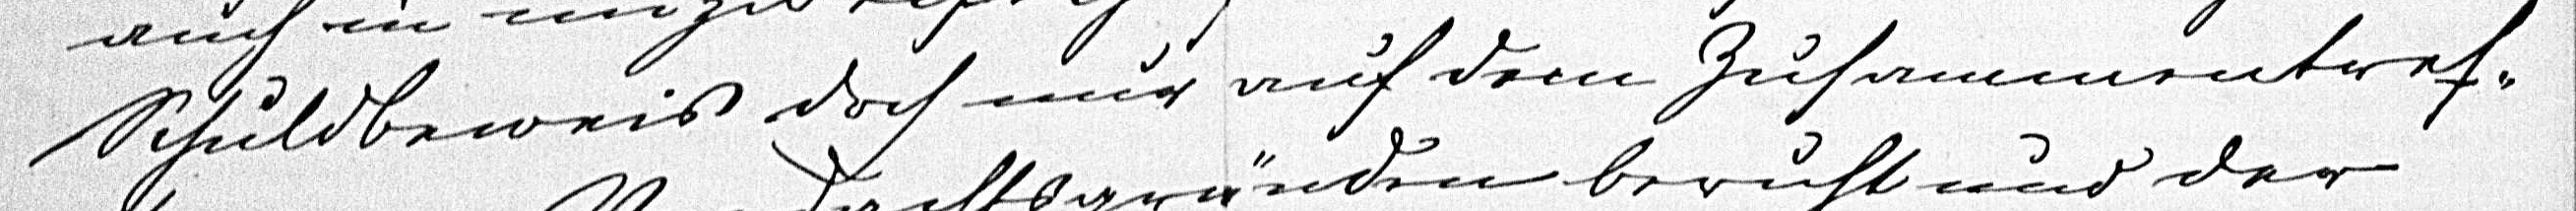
Schuldbeweis doch nur auf dem Zusammentref¬
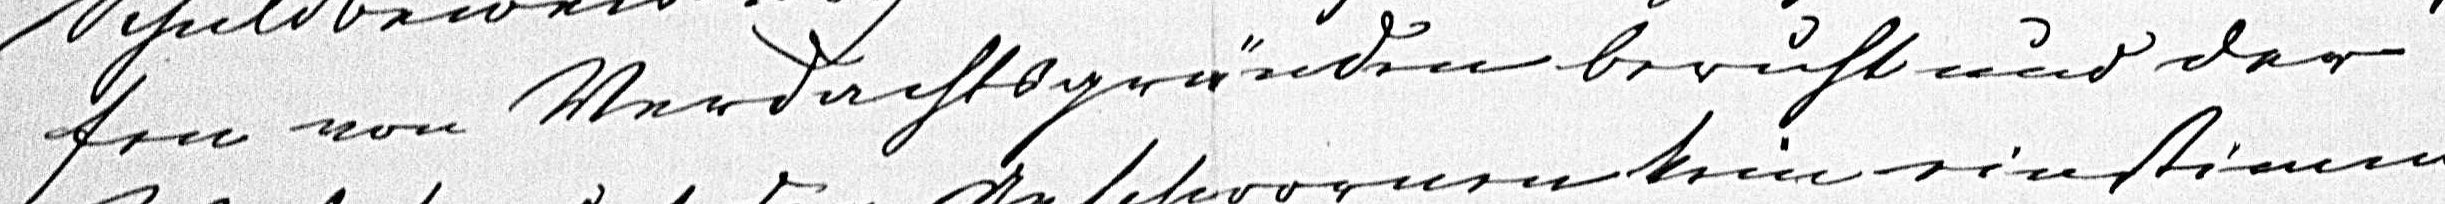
fen von Verdachtsgründen beruht und der
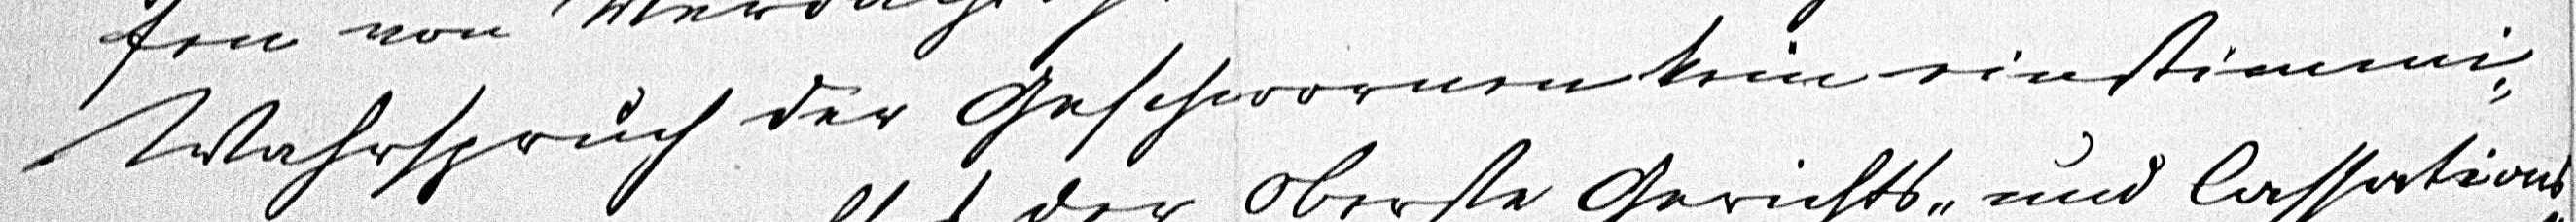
Wahrspruch der Geschworenen kein einstimmi¬
